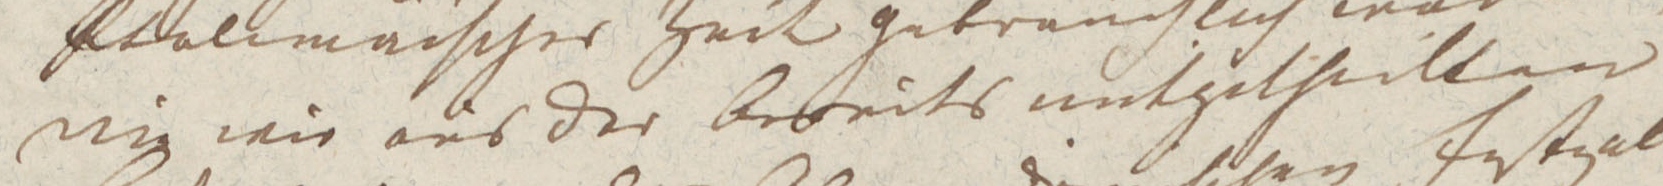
wie wir aus der bereits mitgetheilten
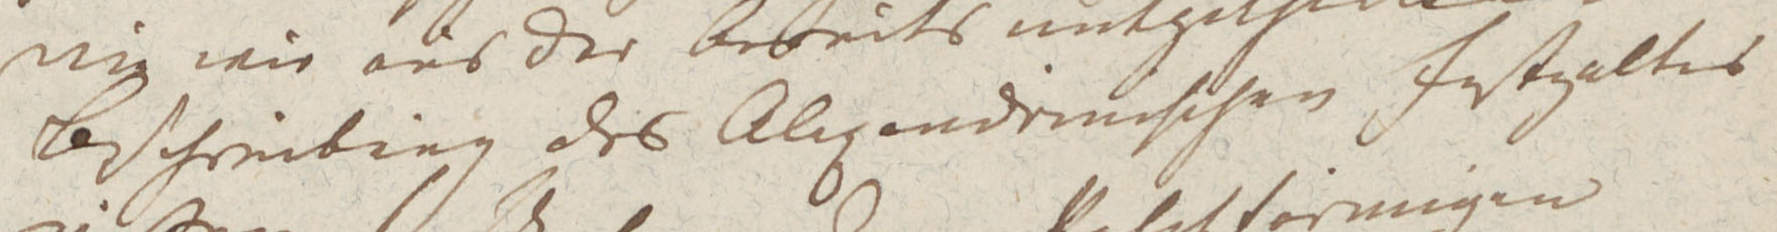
Beschreibung des Alexandrinischen Festzeltes
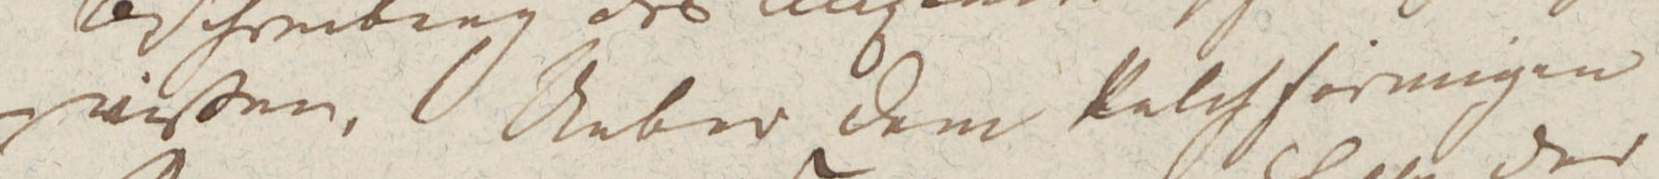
wissen. Ueber dem kelchförmigen
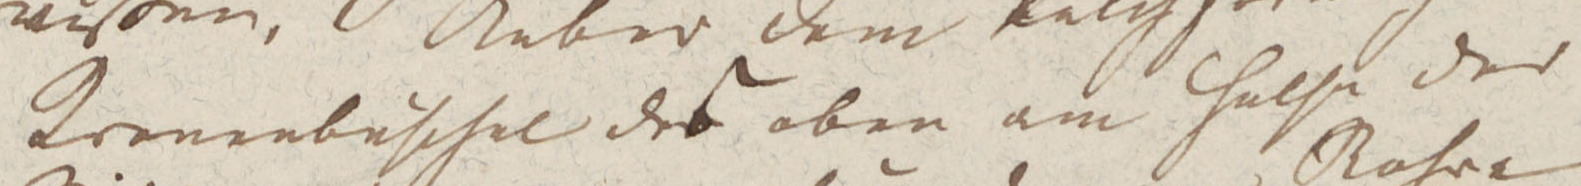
Kronenbüschel ders oben am Halse der
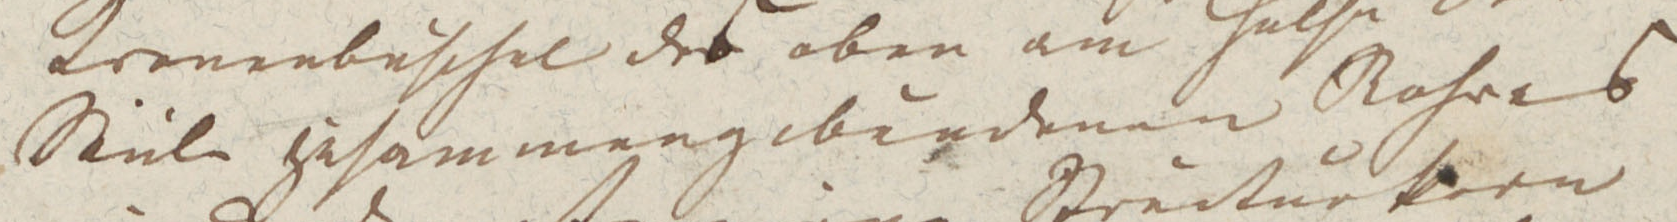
Säule zusammengebundenen Rohres
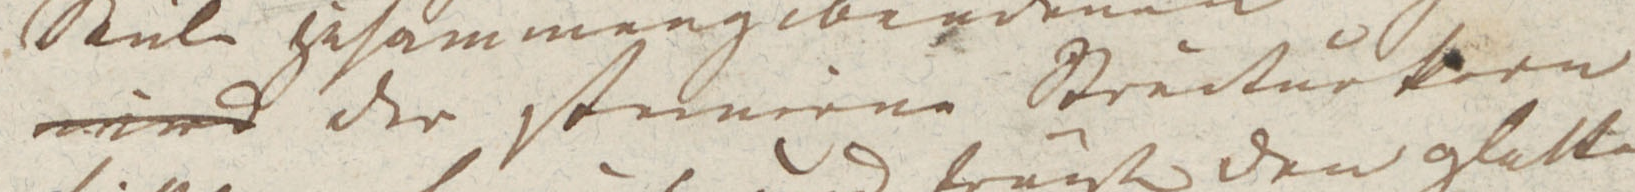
wird der steinerne Structurkern
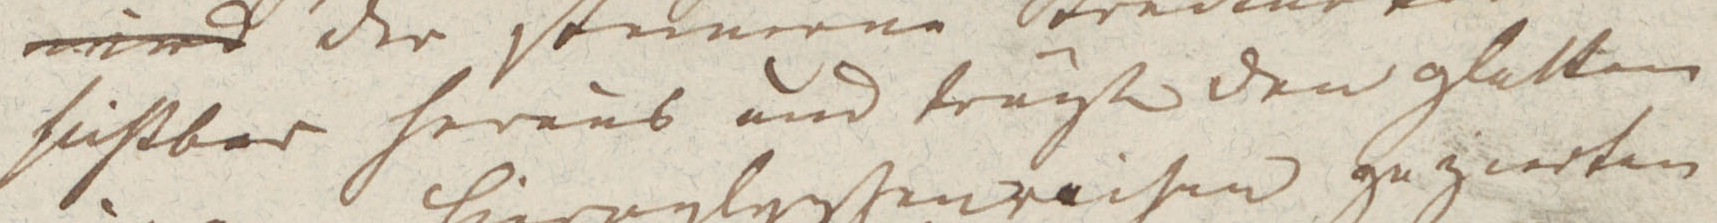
sichtbar heraus und trägt den glatten
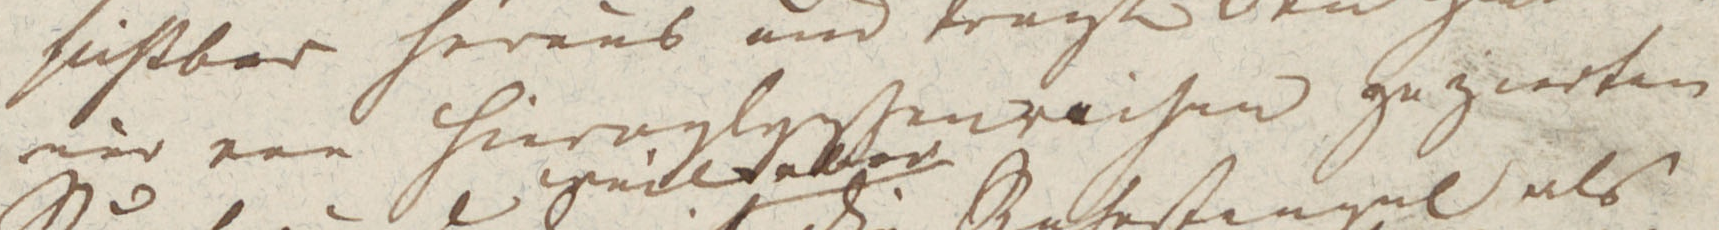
nur von Hieroglyphenreihen gezierten
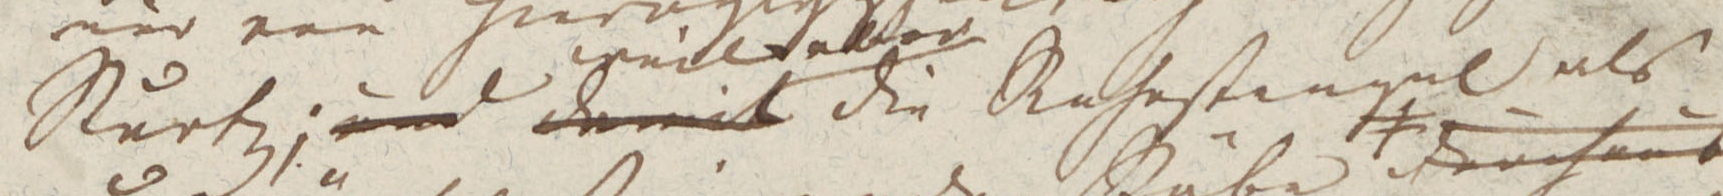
Sturtz; und damit weil aber die Rohrstengel als
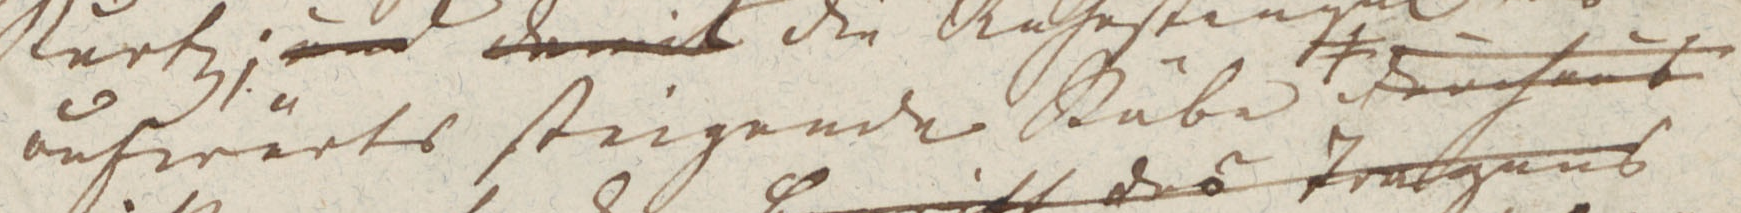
aufwärts steigende Stäbe % durchaus
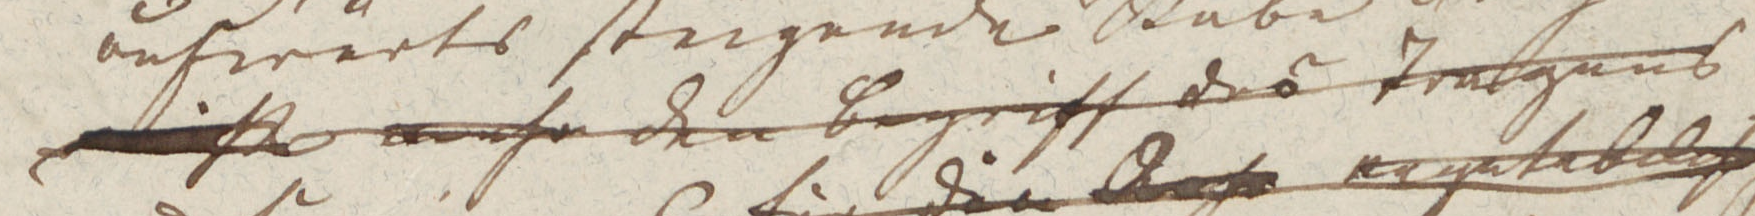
nicht mehr den Begriff des Tragens
